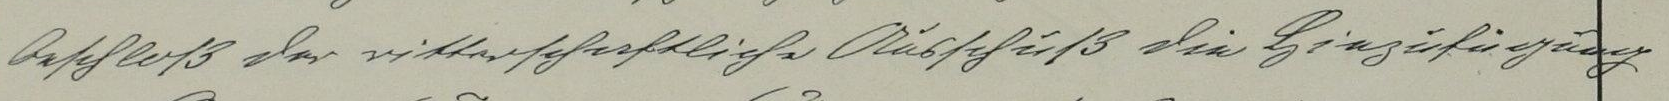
beschloß der ritterschaftliche Ausschuß die Hinzufügung
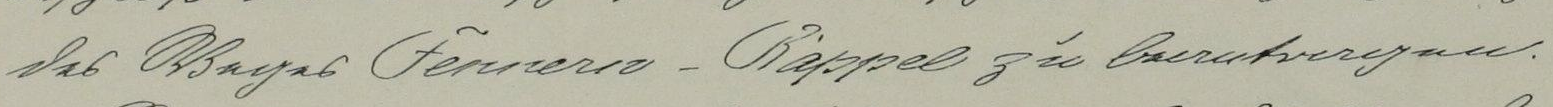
des Weges Fennern – Rappel zu beantragen.
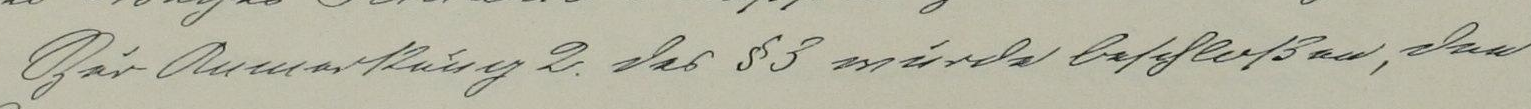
Zur Anmerkung 2. des §3 wurde beschloßen, den
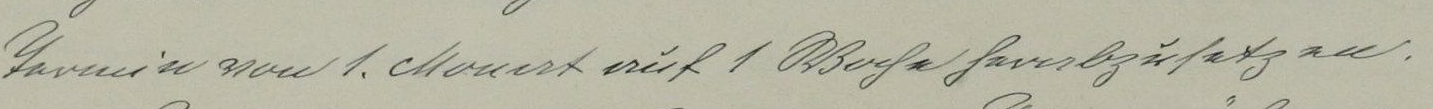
Termin von 1. Monat auf 1 Woche herabzusetzen.
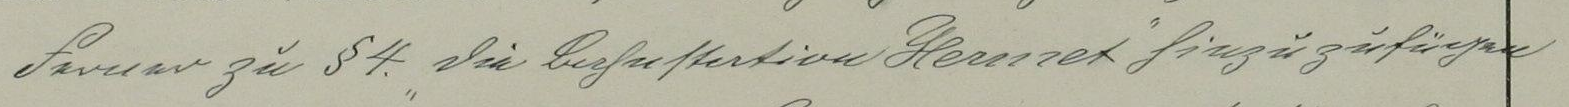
Ferner zu §4. „die Bahnstation Hermet“ hinzuzufügen
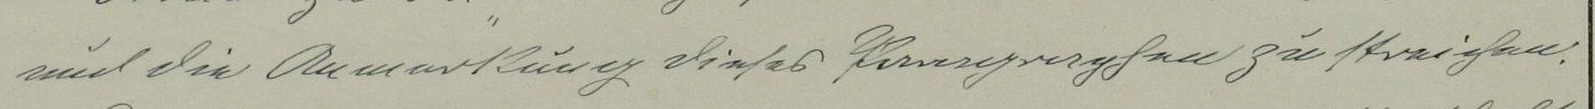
und die Anmerkung dieses Paragraphen zu streichen.
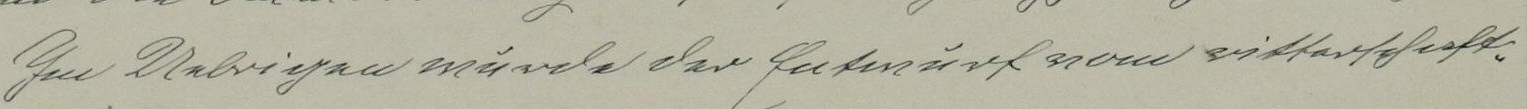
Im Uebrigen wurde der Entwurf vom ritterschaft-
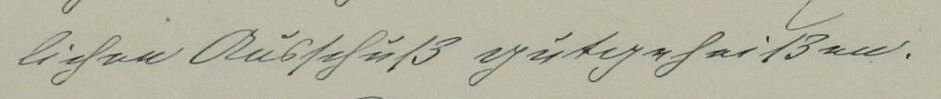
lichen Ausschuß gutgeheißen.
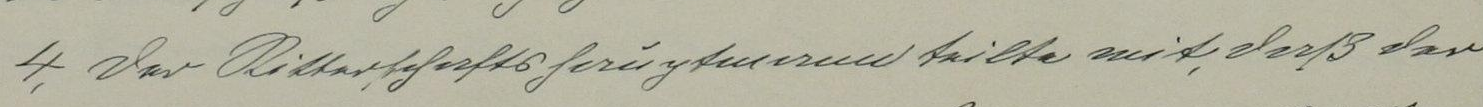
4. Der Ritterschaftshauptmann teilte mit, daß der
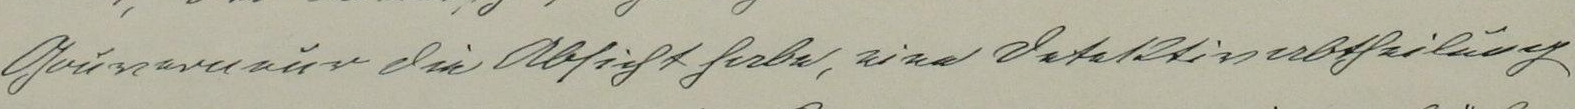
Gouverneur die Absicht habe, eine Detektivabtheilung
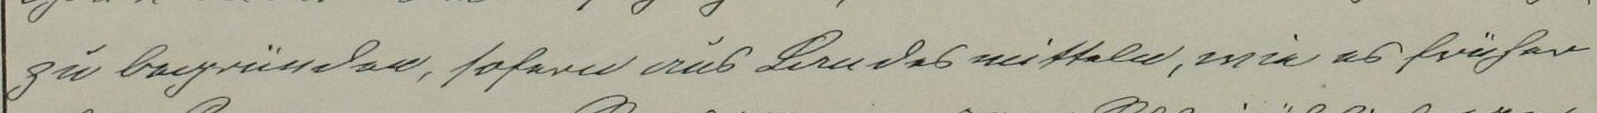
zu begründen, sofern aus Landesmitteln, wie es früher
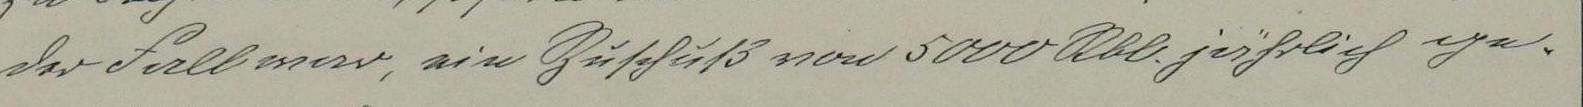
der Fall war, ein Zuschuß von 5000 Rbl. jährlich ge-
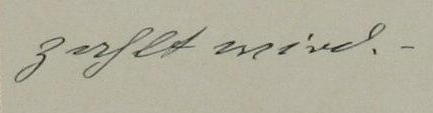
zahlt wird.
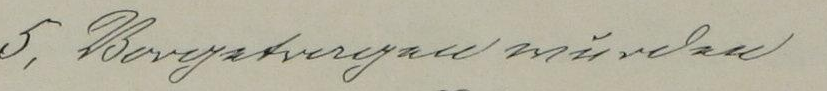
5. Vorgetragen wurden
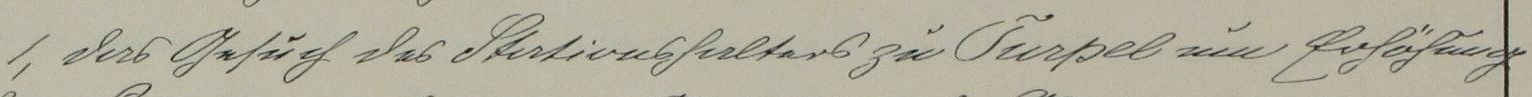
1. das Gesuch des Stationshalters zu Turpel um Erhöhung
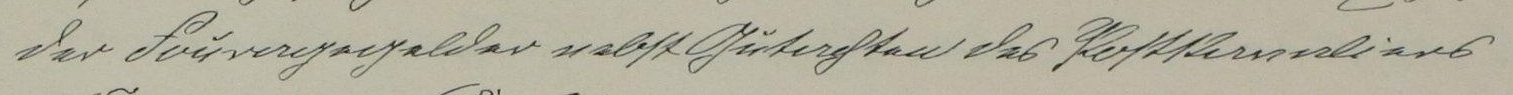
der Fouragegelder nebst Gutachten des Postkavaliers
